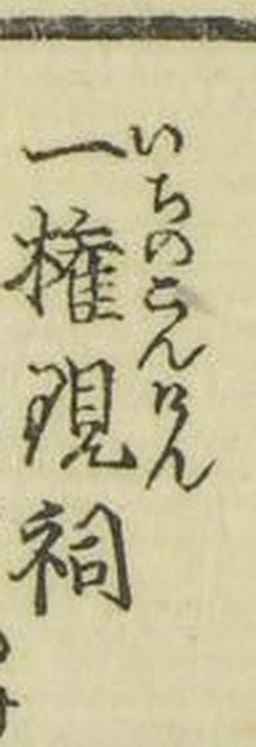一権現祠
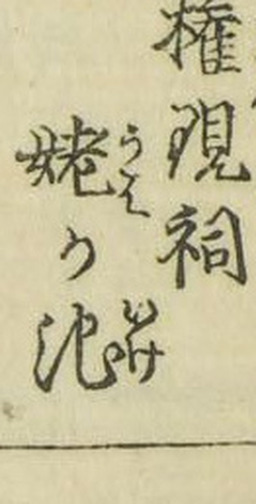姥か池
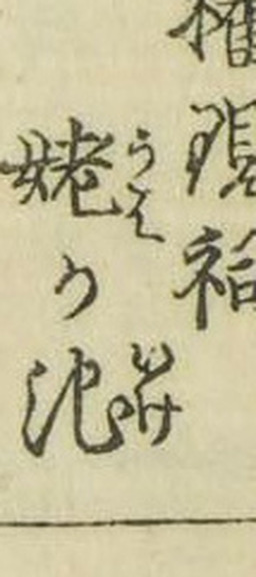姥か池
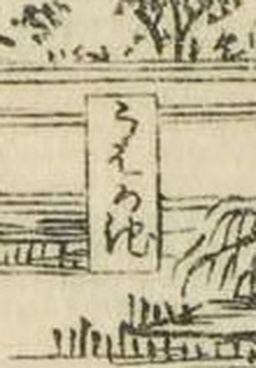うはか池
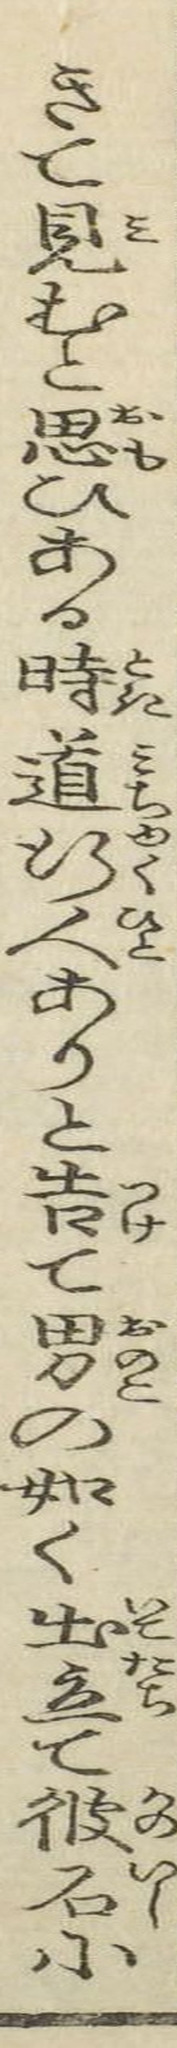きて見むと思ひある時道行人ありと告て男の如く出立て彼石に
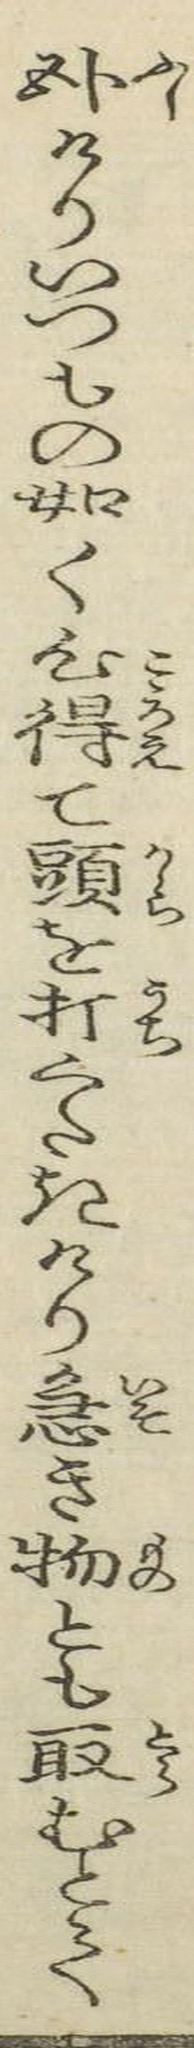臥けりいつもの如く心得て頭を打くたきけり急き物とも取むとて
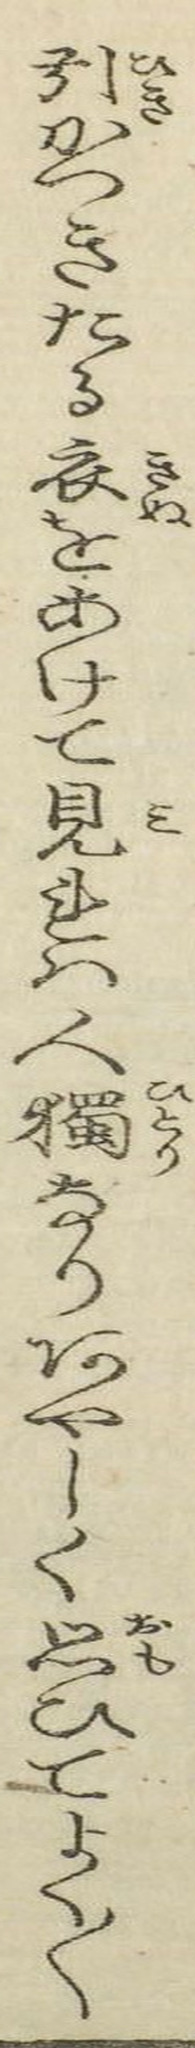引かつきたる衣をあけて見れは人独なりあやしく思ひてよく〳〵
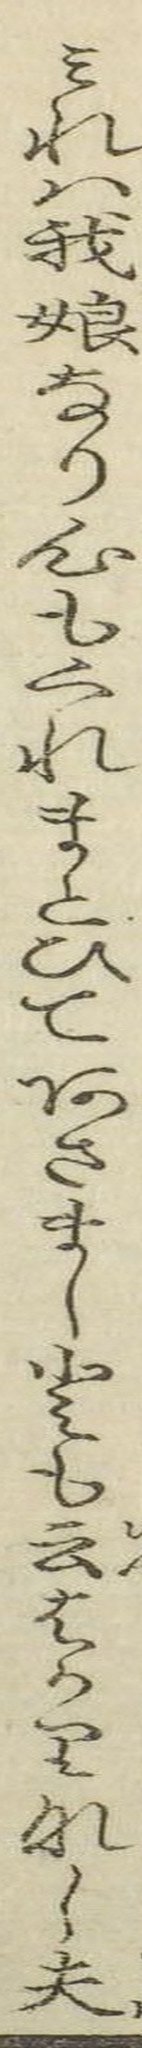みれは我娘なり心もくれまとひてあさましとも云はかりなし夫
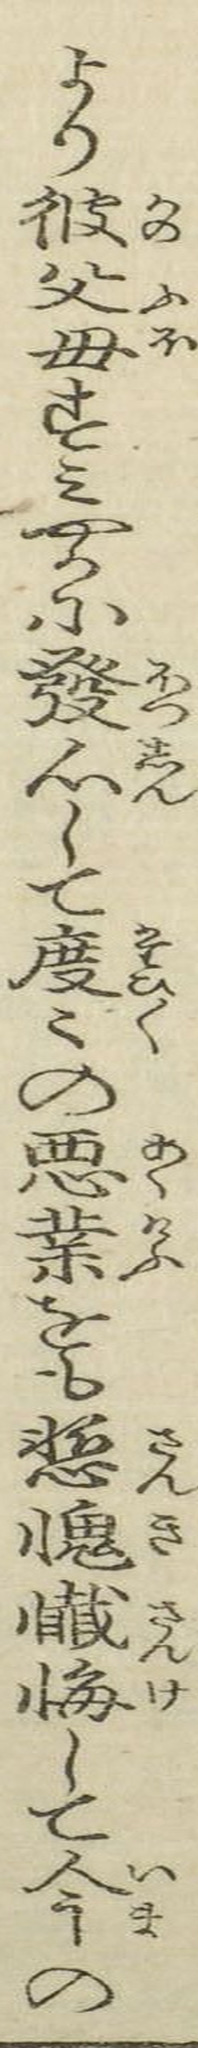より彼父母すみやかに発心して度々の悪業をも慙愧懺悔して今の
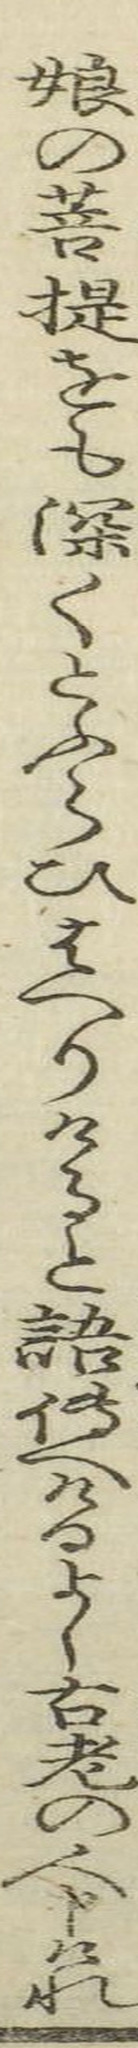娘の菩提をも深くとふらひはへりけると語伝へけるよし古老の人申けれ
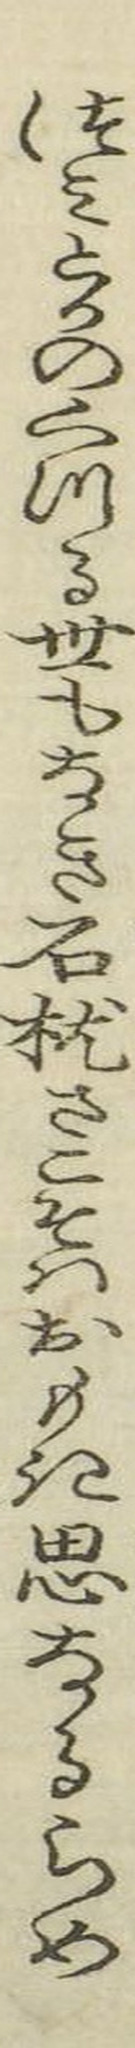つみとかのくつる世もなき石枕さこそはおもき思なるらめ
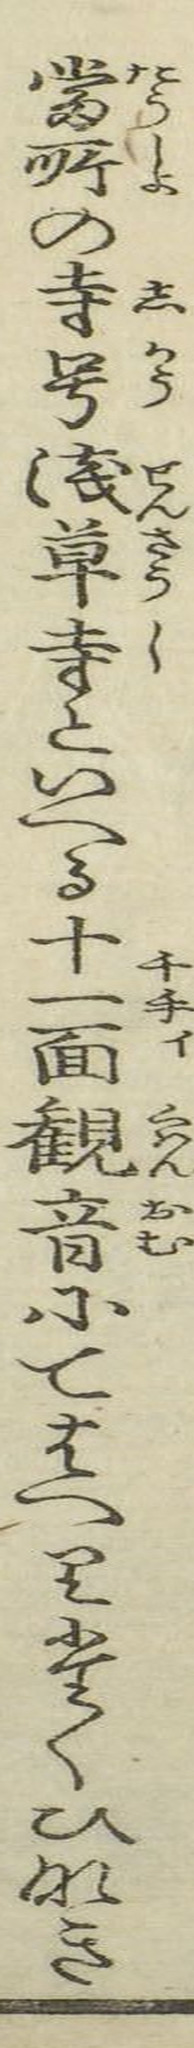当所の寺号浅草寺といへる十一面観音にてはへりたくひなき
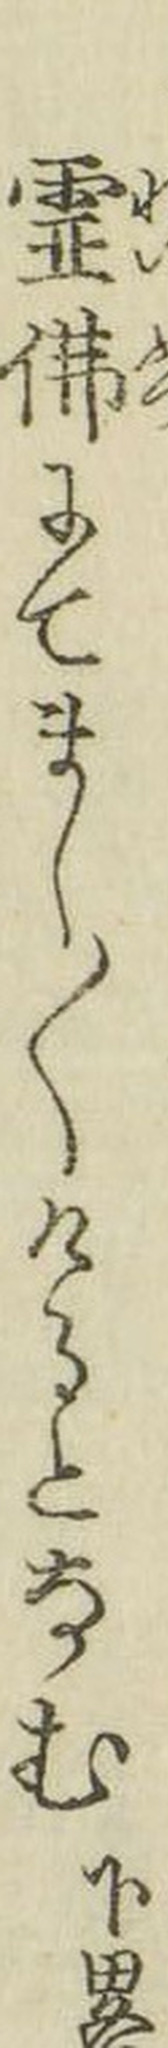霊仏にてまし〳〵けるとなむ下略
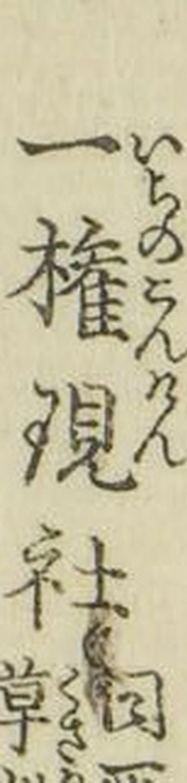一権現祠

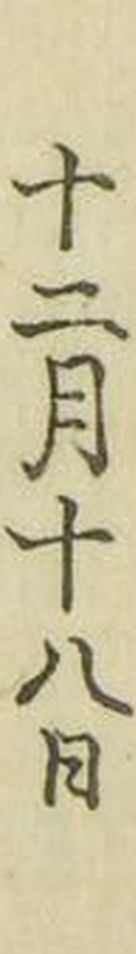十二月十八日
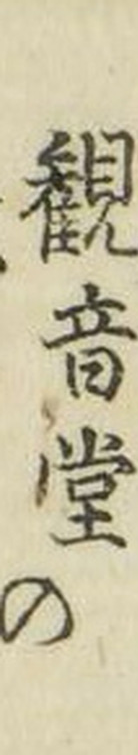観音堂の
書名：江戸名所図会 20巻 巻之16
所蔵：東京学芸大学教育コンテンツアーカイブ
